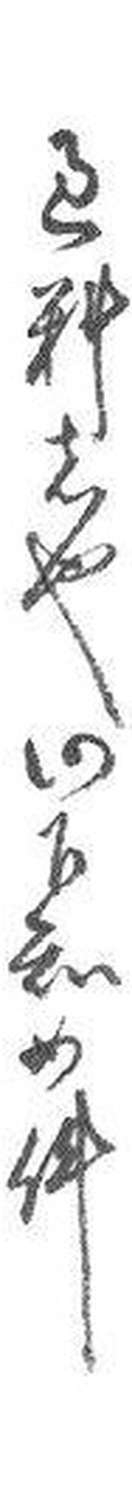過料者也仍下知如件
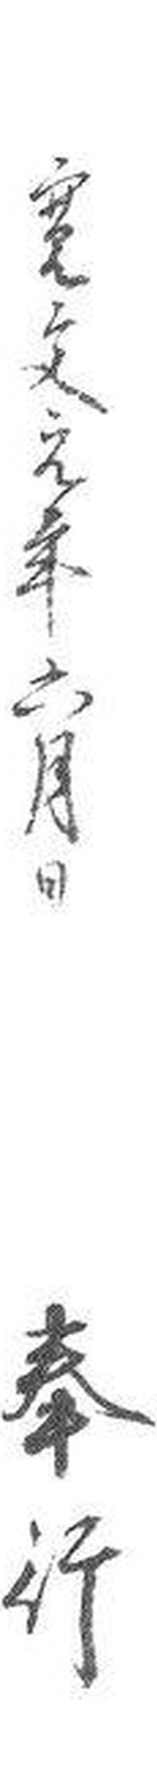寛文元年六月日奉行
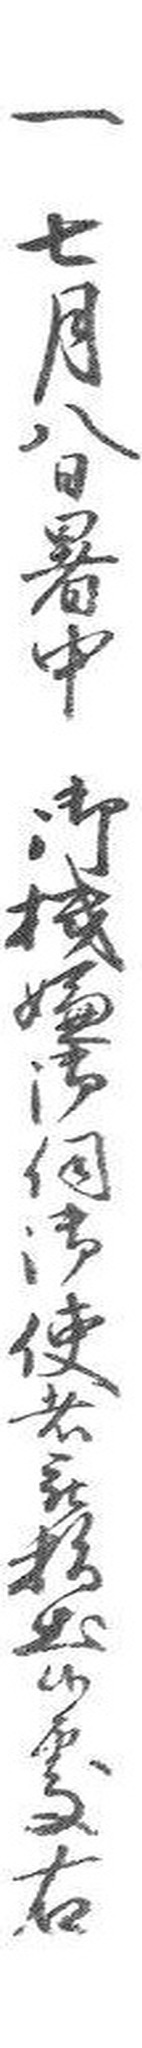一七月八日暑中御機嫌御伺御使者被指出候処右
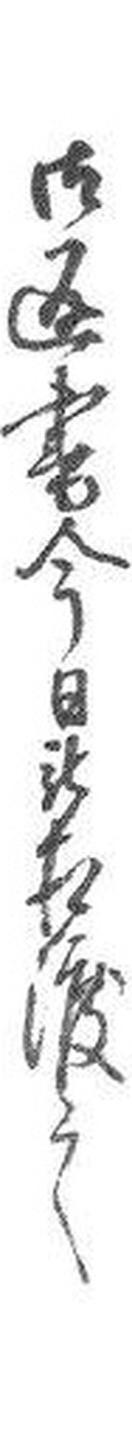御返書今日被相渡之
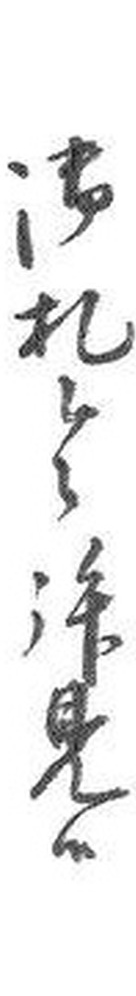御札令拝見候
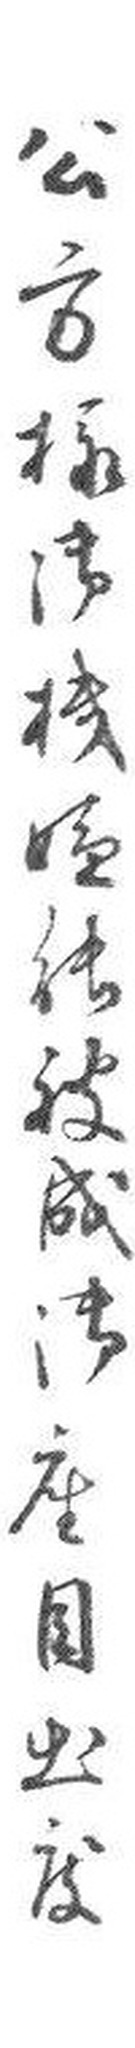公方様御機嫌能被成御座目出度
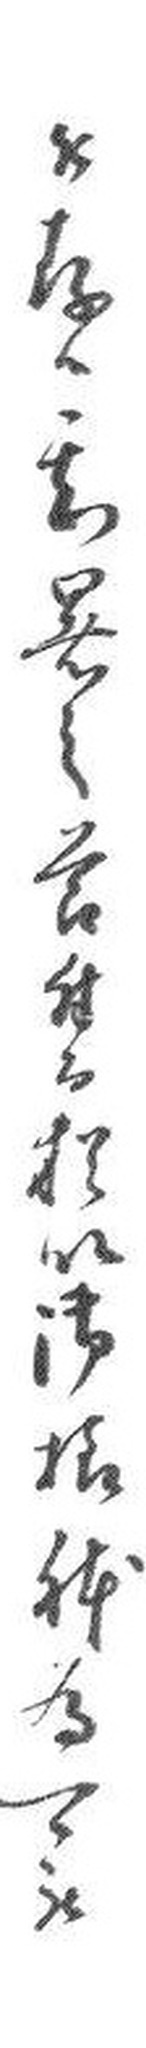被存候甚暑之節付而猶以御様体為可被
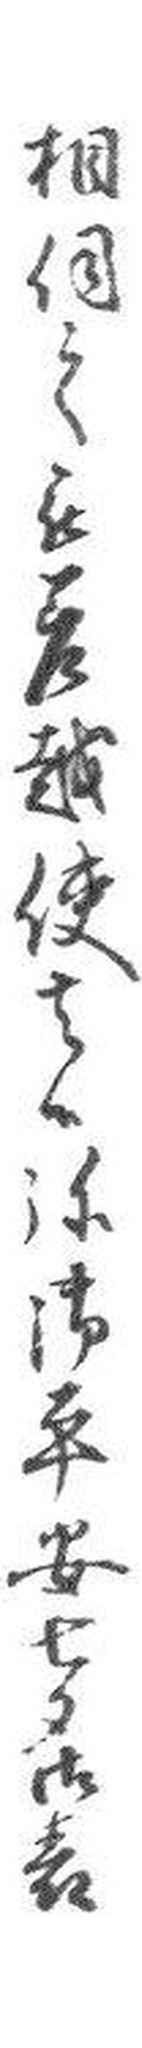相伺之被差越使者候弥御平安七夕御表
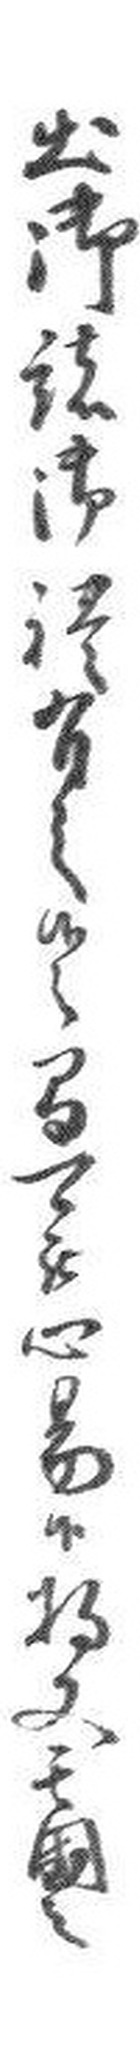出御諸御礼有之候之間可被心易候将又其国之
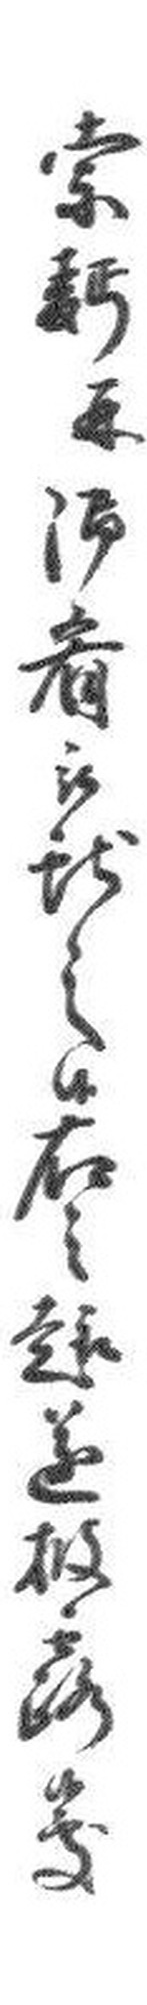索麪并御肴被献之候右之趣遂披露候処
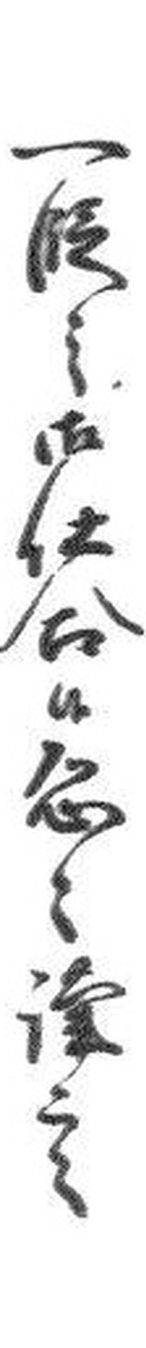一段之御仕合候恐々謹言
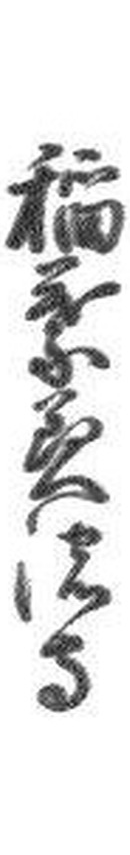稲葉美濃守
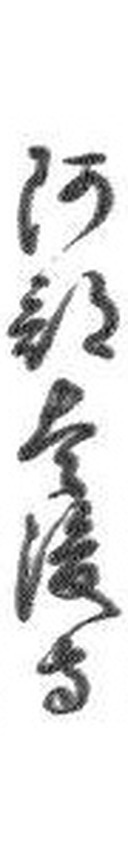阿部豊後守
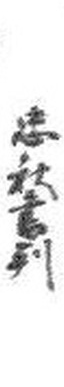忠秋書判
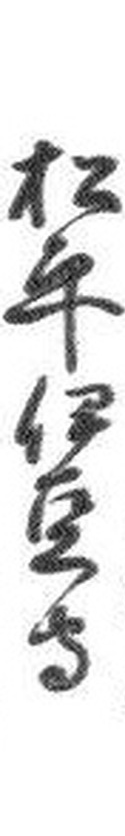松平伊豆守
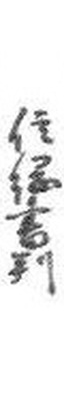信綱書判
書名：家譜 六 光通公 従万治三年到寛文三年
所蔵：福井県文書館 Fukui Prefectural Archives
